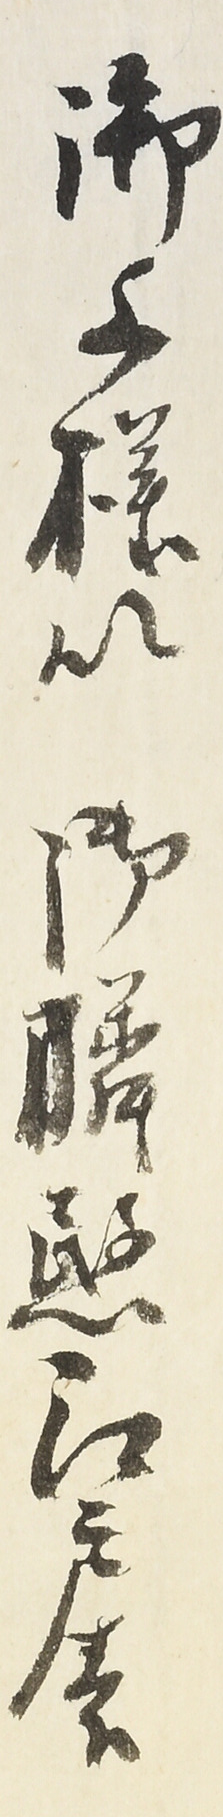御上様以御憐愍江戸表
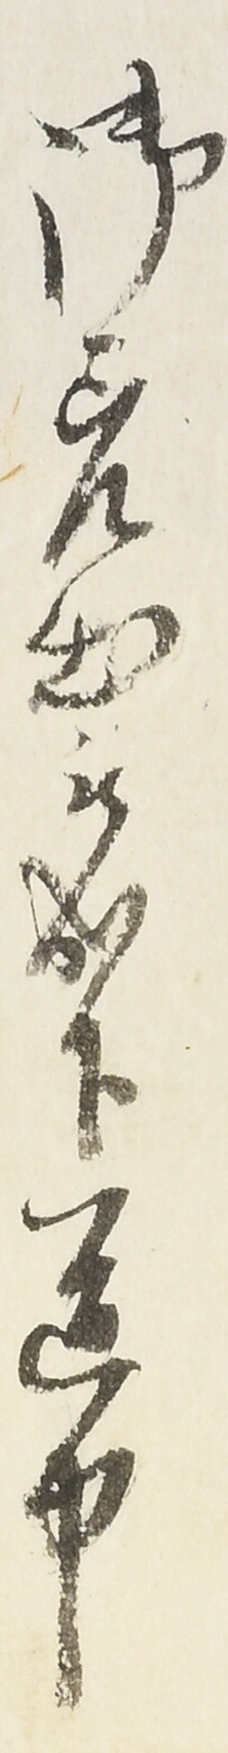御差出被成下道中
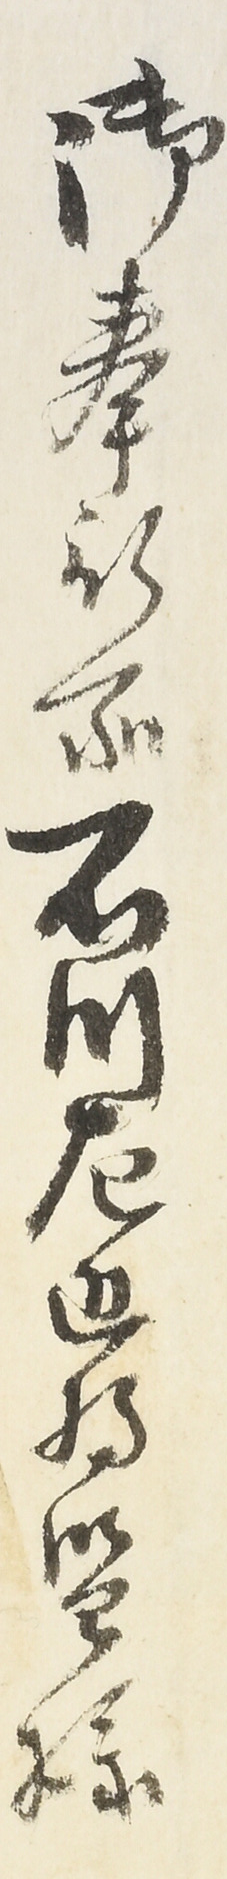御奉行所石川左近将監様

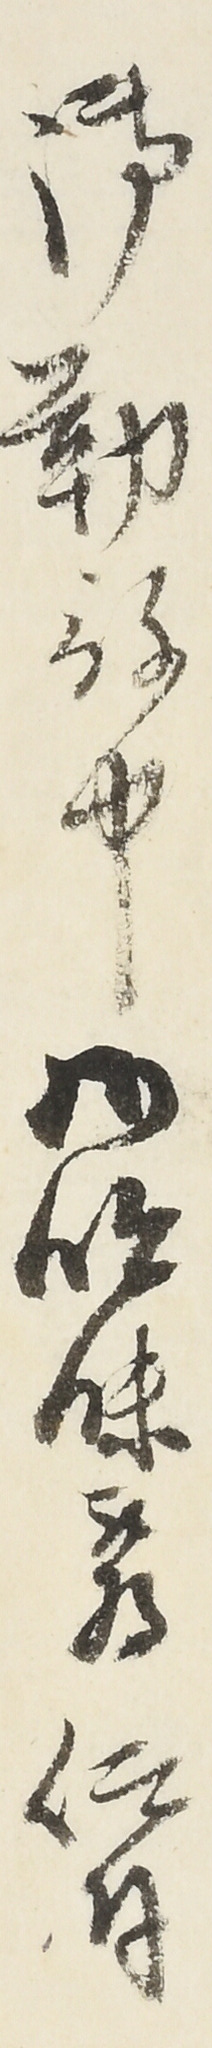御勤役中御吟味被為仰付
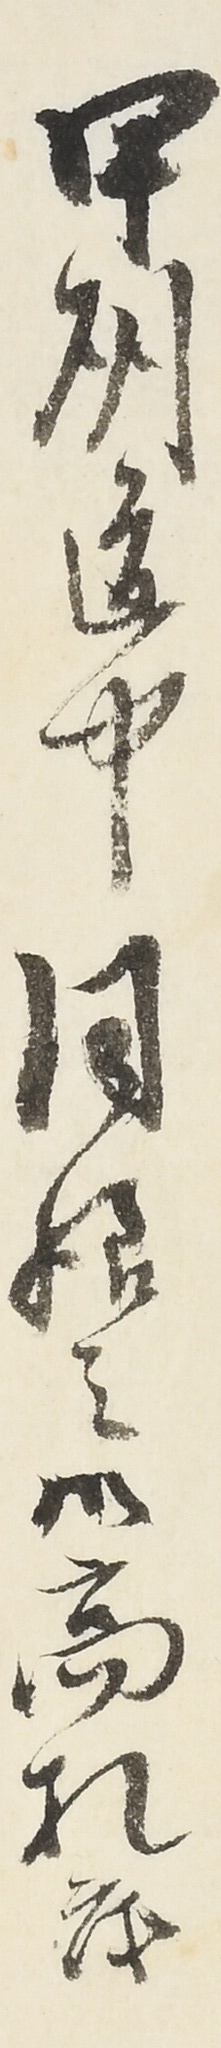甲州道中同様之御高札も
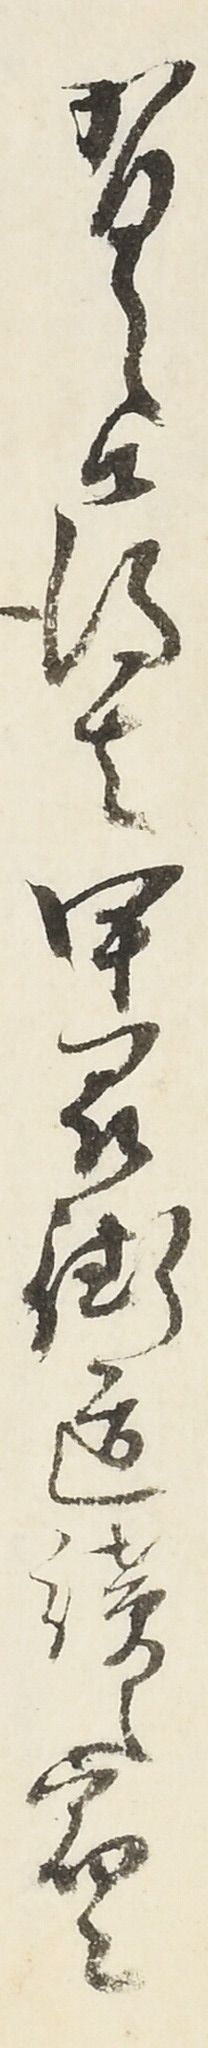有之候得は甲州街道続之宿々
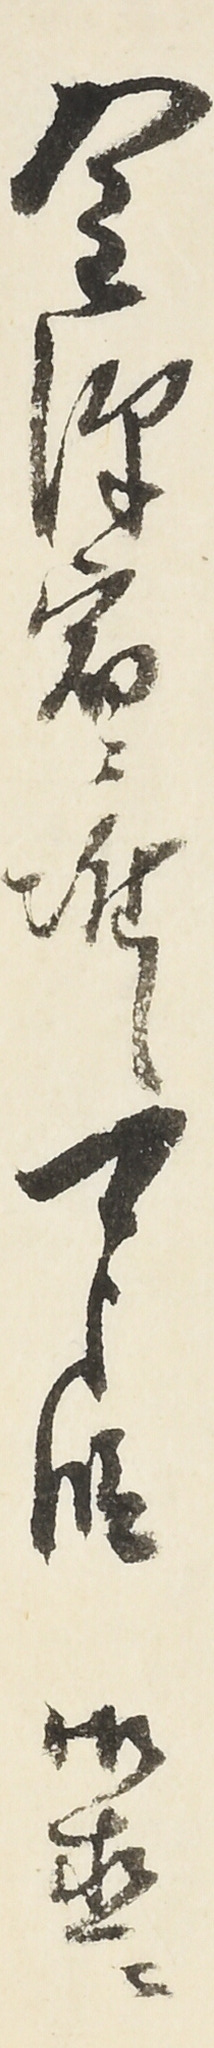金澤宿に准し可申段御直に
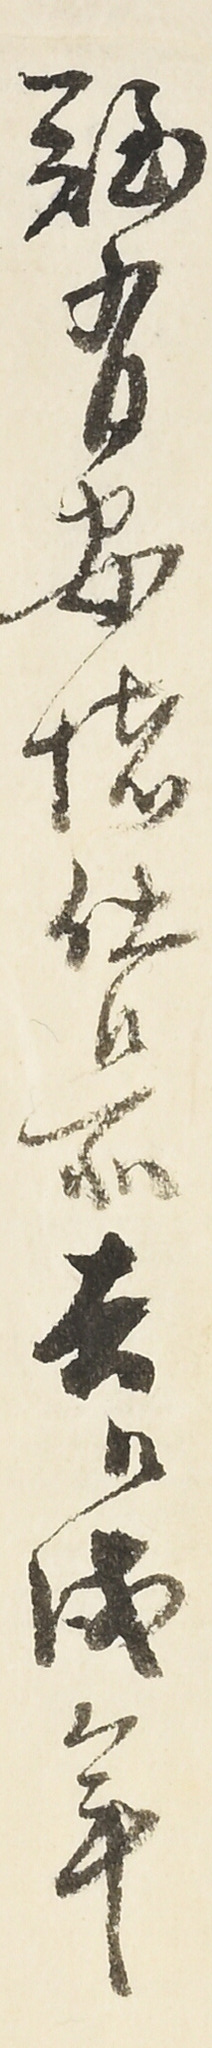難有安堵仕候所去る戌年
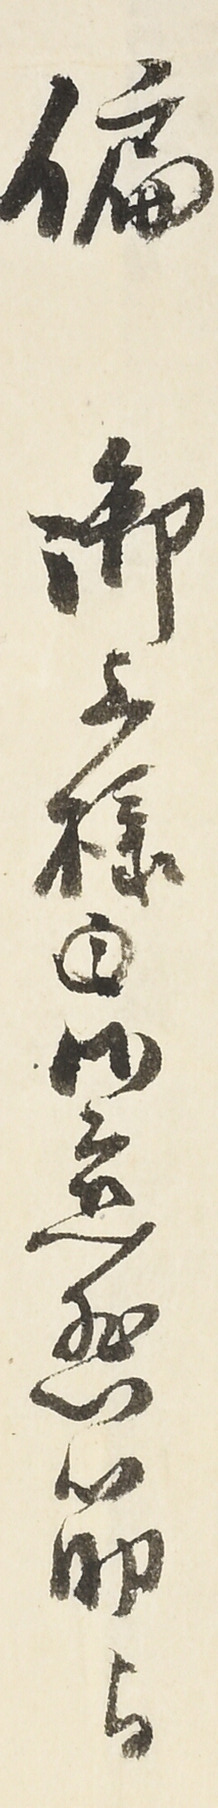偏御上様之御慈悲筋と
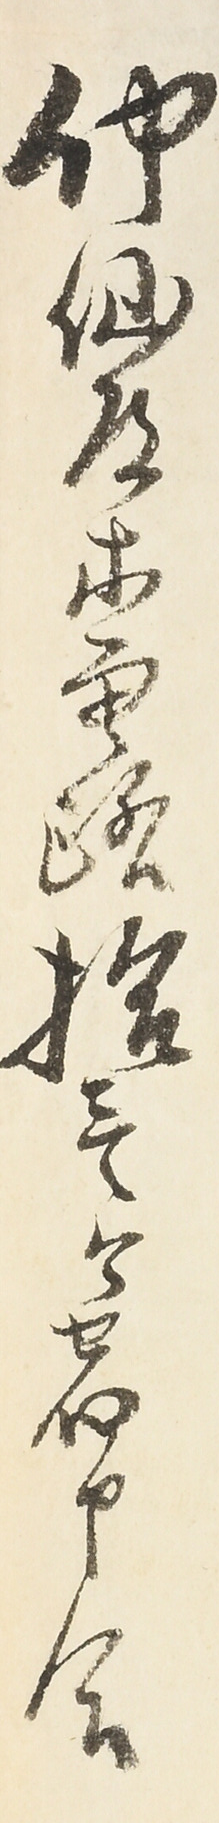仲仙道木曽路拾壱ヶ宿申合
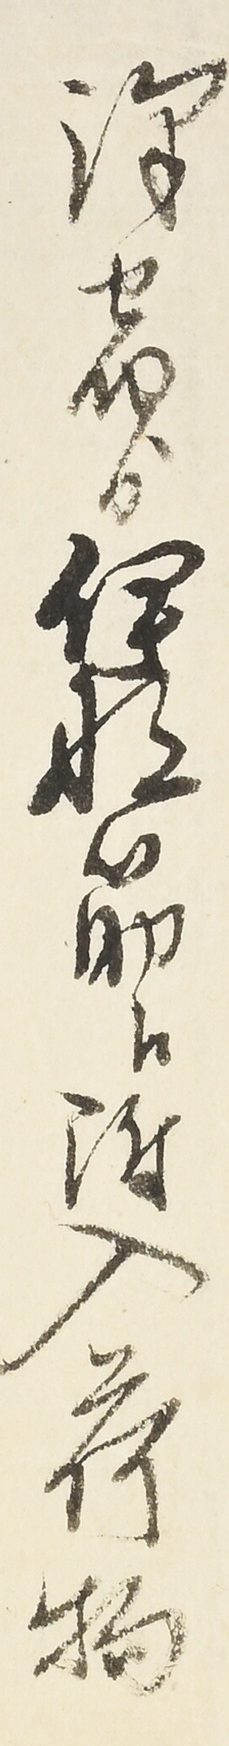沢宿ゟ伊那筋え付入荷物
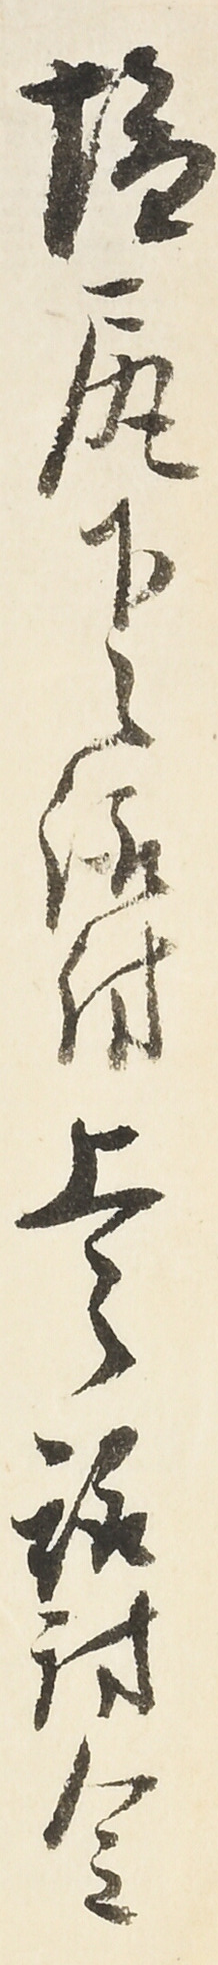塩尻下之諏訪上之諏訪金
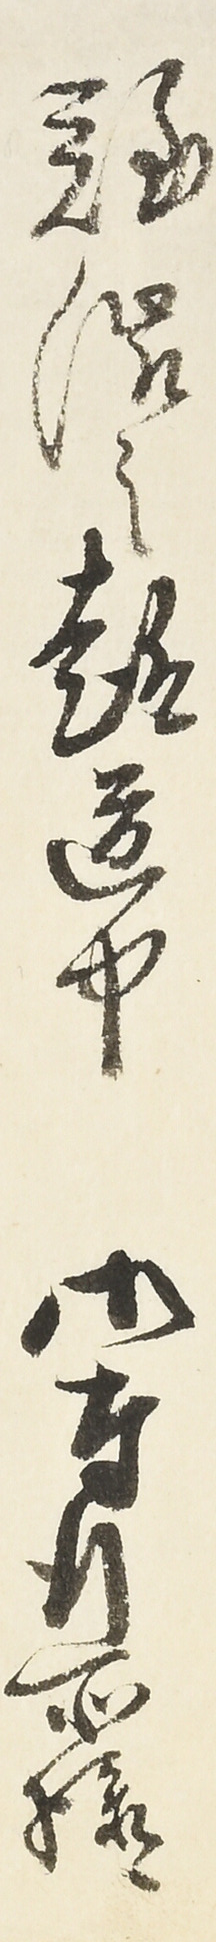難渋之趣道中御奉行所様へ
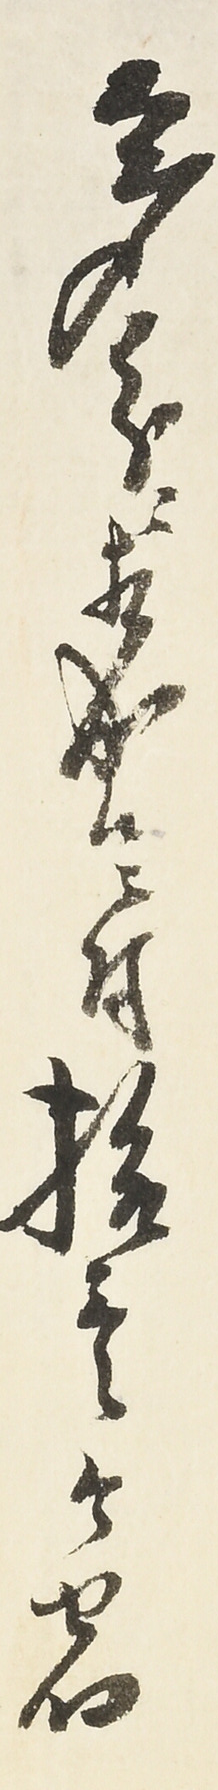多分に相成候に付拾壱ヶ宿
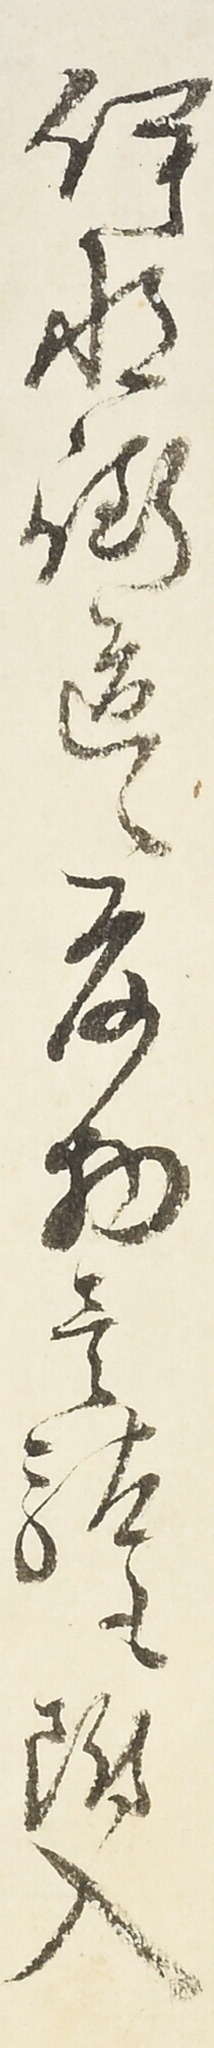伊那街道へ荷物壱駄も付入
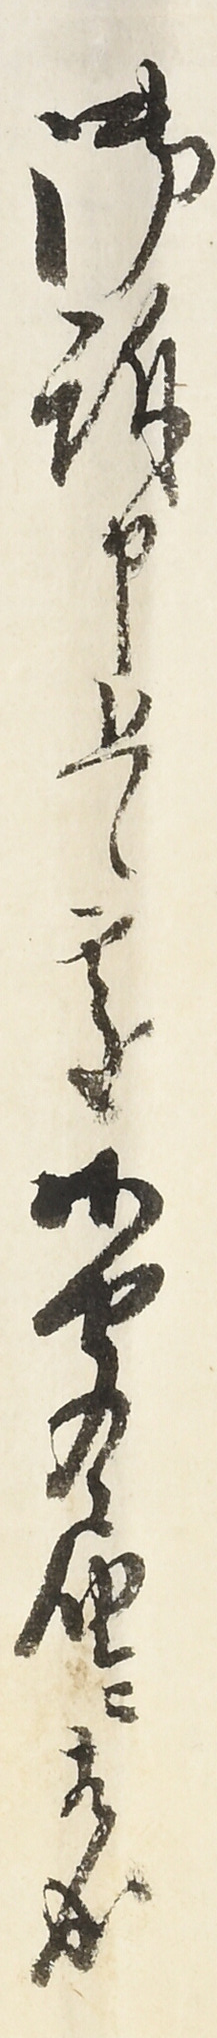御訴申上候処御聞届に相成
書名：乍恐以書付嘆願奉申上候
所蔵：伊那市立高遠町図書館・合同会社AMANE
